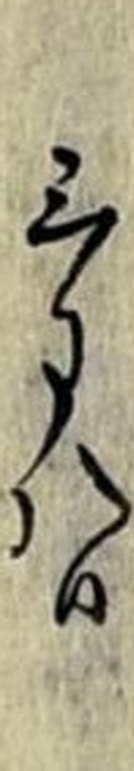三月八日
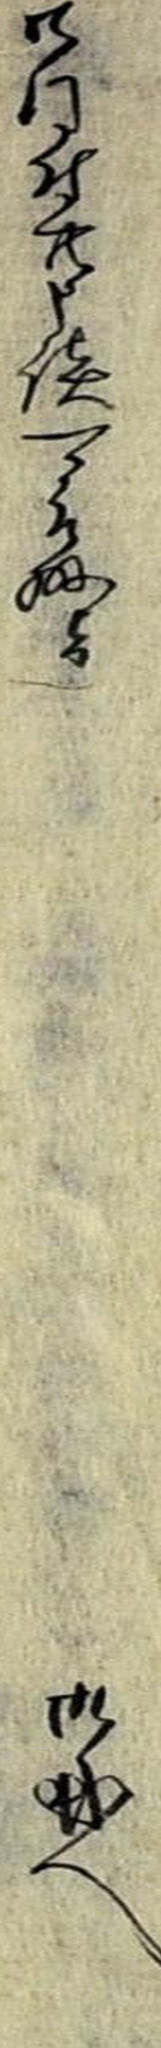〇御目付共申談可被取扱旨御用人
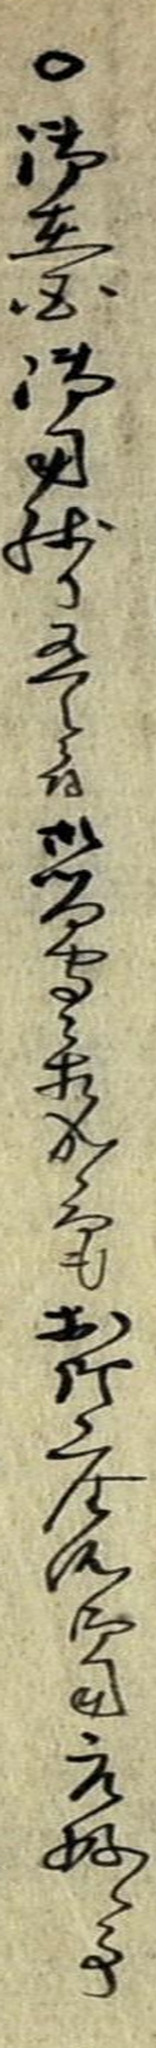〇御在国御用残り有之ニ付御留守ニ相成候而も於御座所御用取扱候事
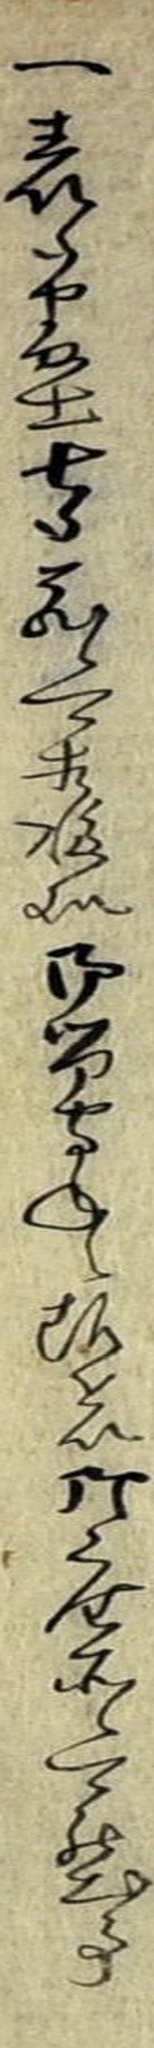一表御番士七ツ蔵へ可相移処御留守年之趣を以御座所へ可罷出事
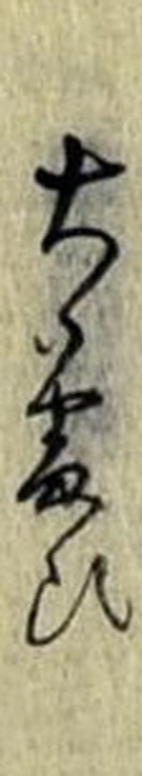大御番頭
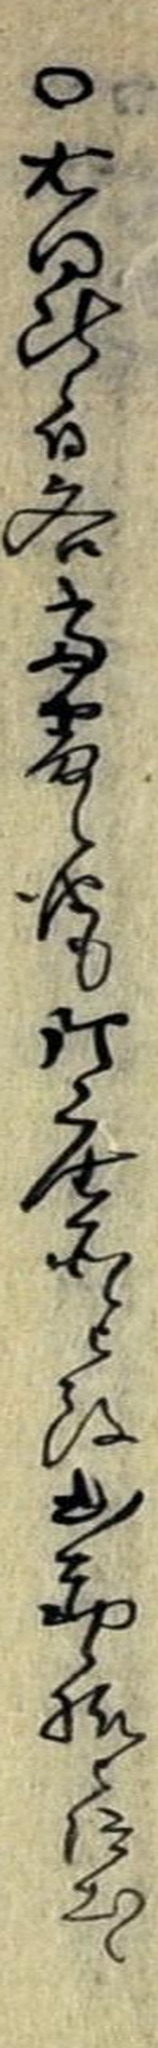〇右同断ニ付各当番之儀も御座所へ被致出勤候様被仰出候
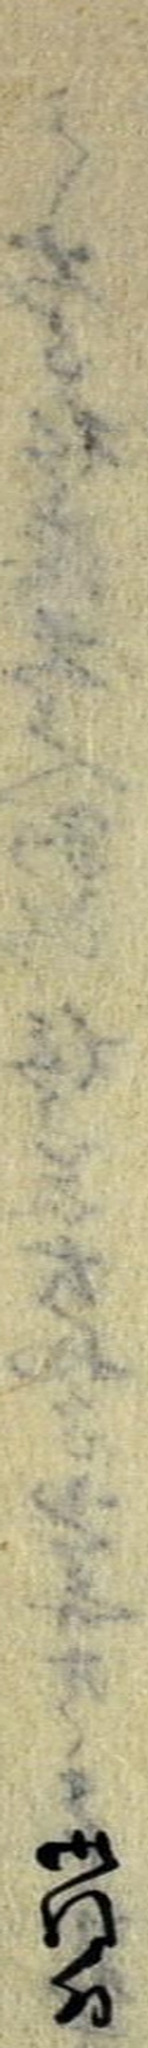御目付
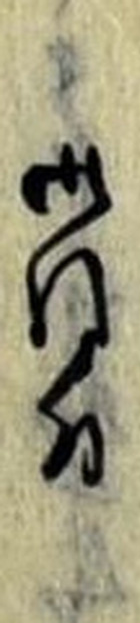御目付
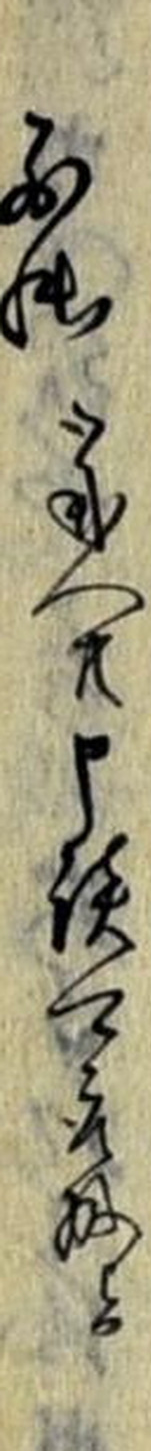別紙御用人共申談可取扱旨
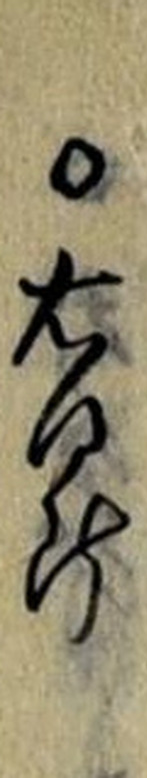〇右同断
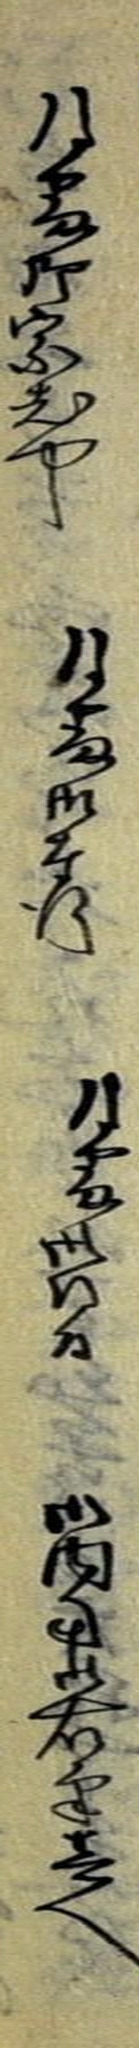月番御家老中月番御奉行月番御目付御内用御右筆壱人
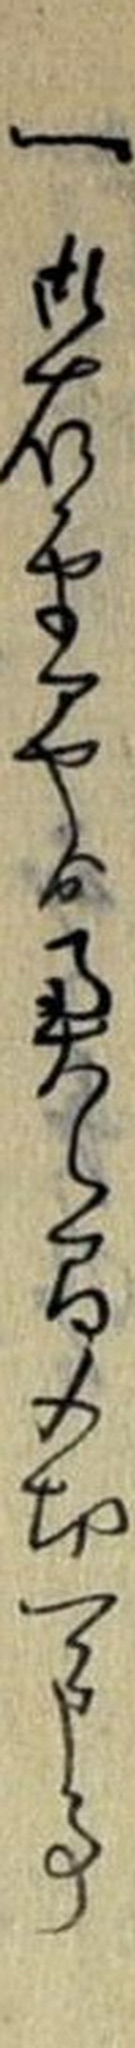一御右筆部屋ゟ奥之間〆切可申事
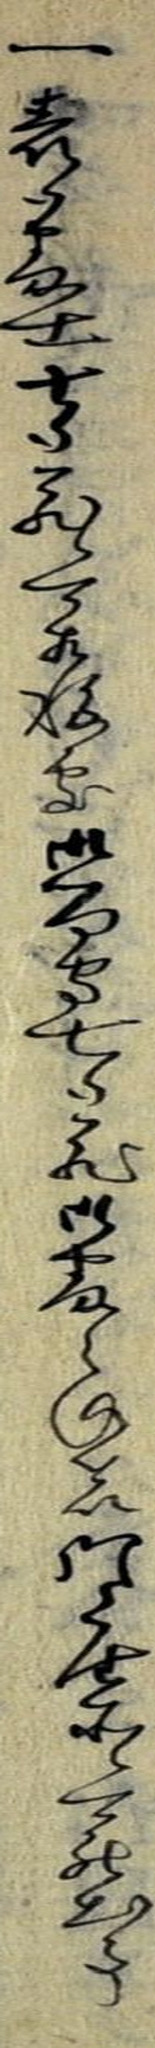一表御番士七ツ蔵へ可相移処御留守七ツ蔵御番之趣を以御座所へ可罷出事
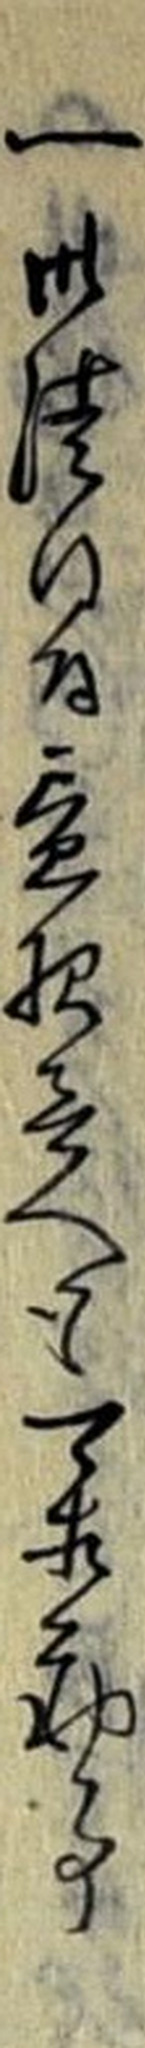一御徒目付昼夜壱人ツヽ可相勤事
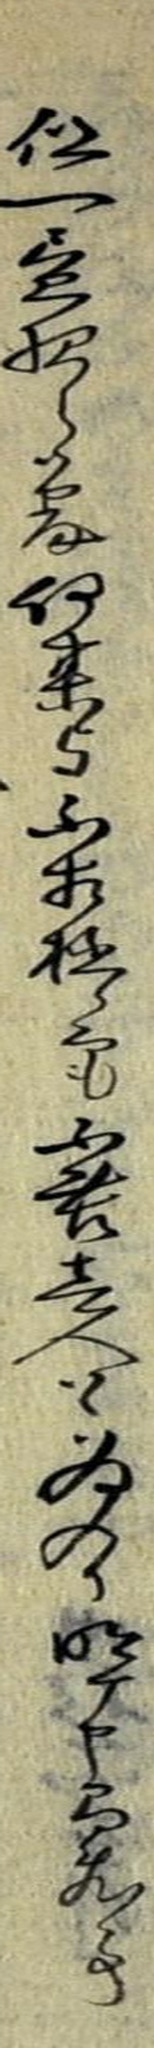但一昼夜之御番何某与不相極候而も不苦壱人ツヽ為〆り明ケ申間敷事
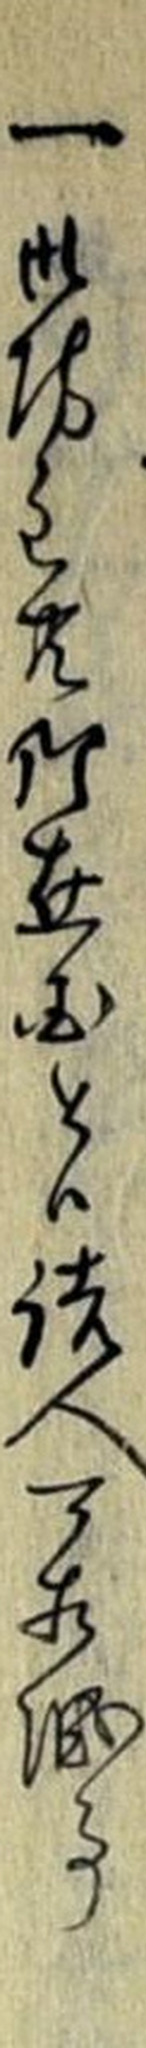一御坊主共御在国とハ諸人可相減事
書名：命令之部 三
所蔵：福井県文書館 Fukui Prefectural Archives
